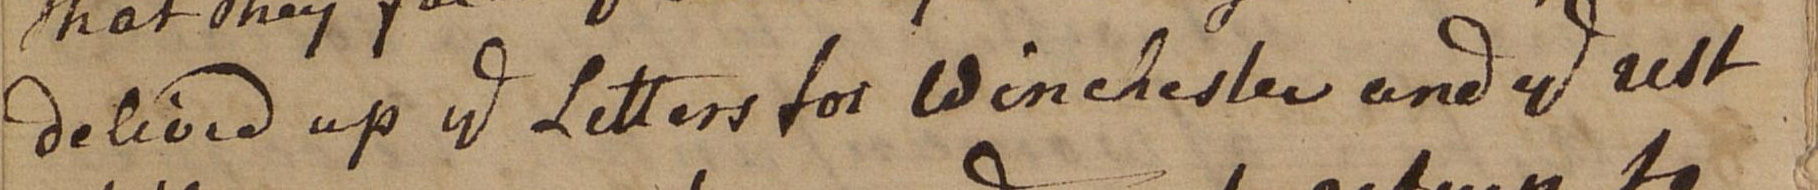delived up y^e Letters for Winchester and y^e rest
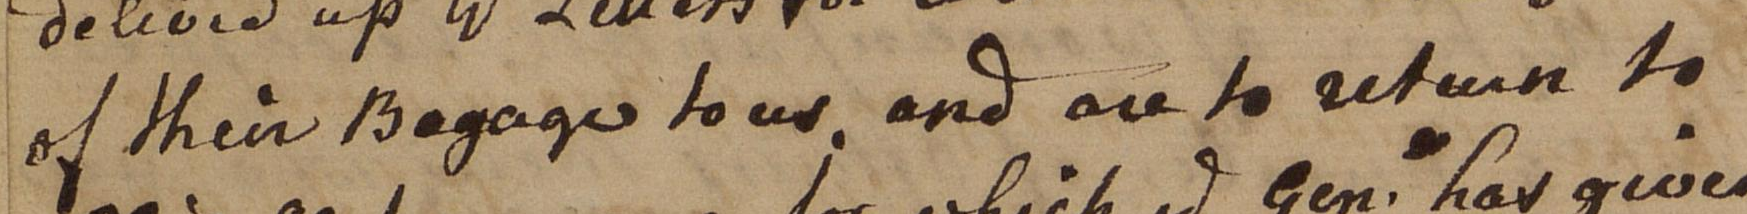of their Bagage to us, and are to return to
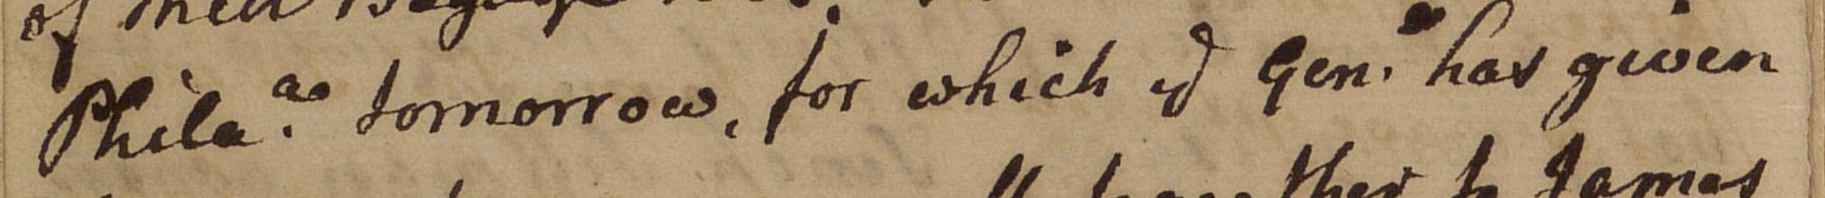Phila^a. tomorrow, for which y^e Gen^l. has given
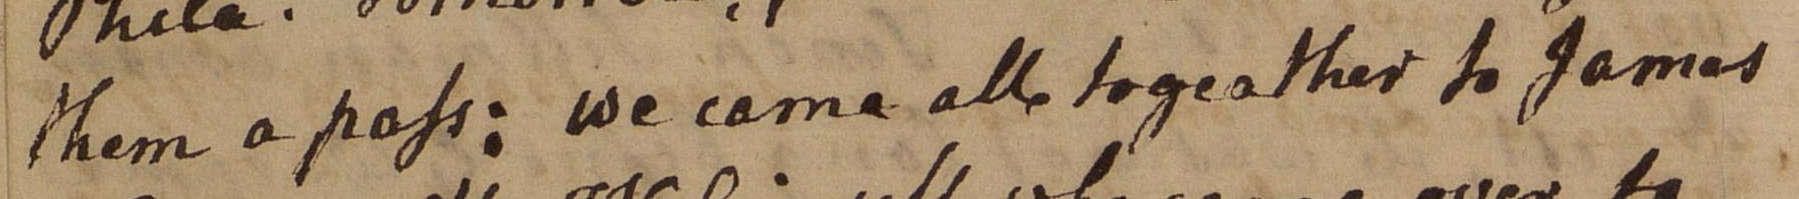them a pass: we came all togeather to James
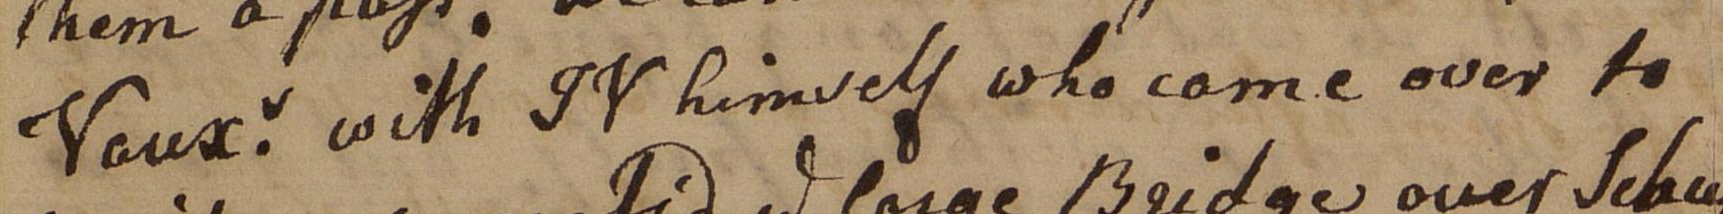Vaux^s. with JV himself who came over to
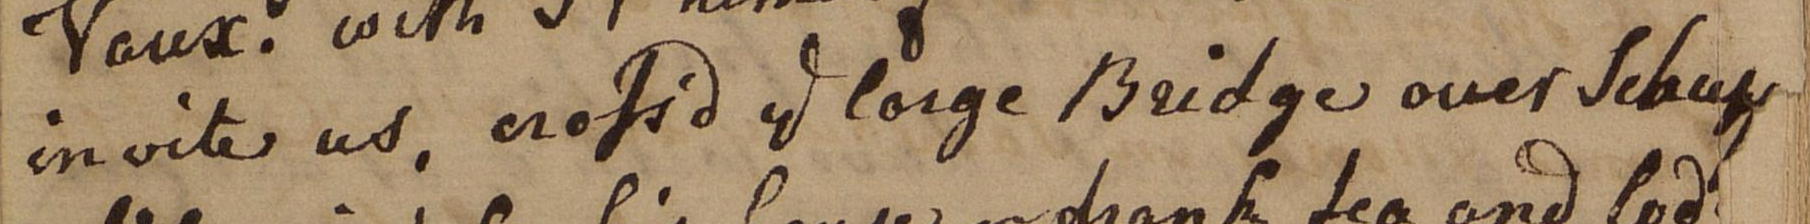invite us, cross'd y^e large Bridge over Schuy
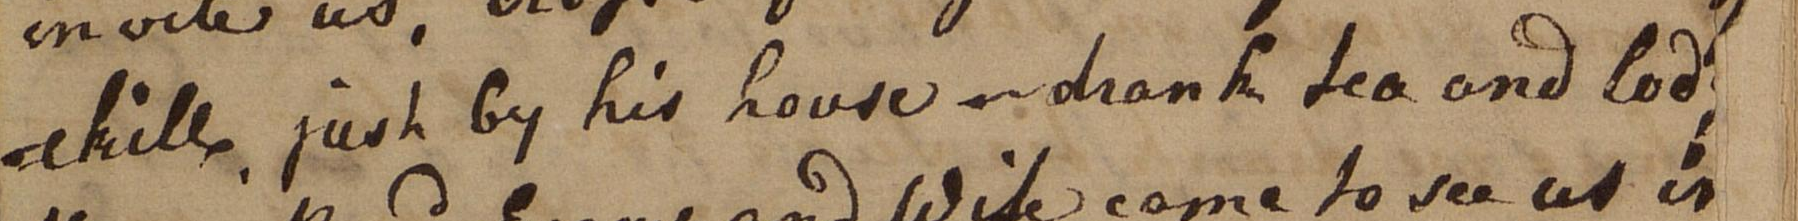-chill, just by his house- drank tea and lod
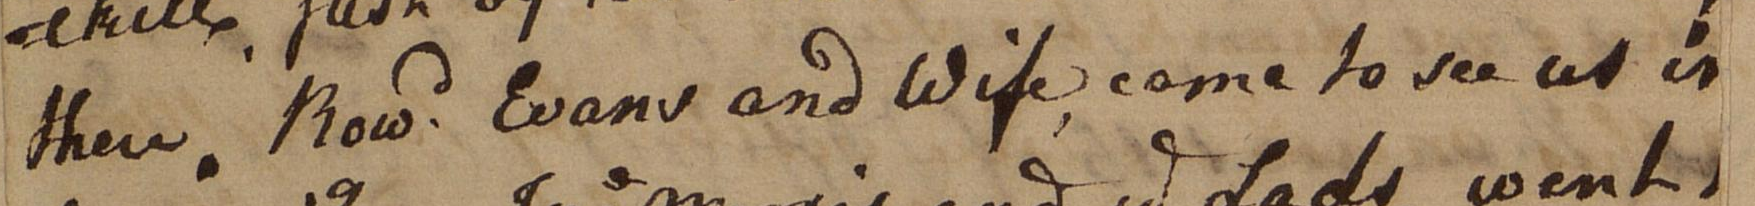there. Row^d. Evans and Wife, come to see us in
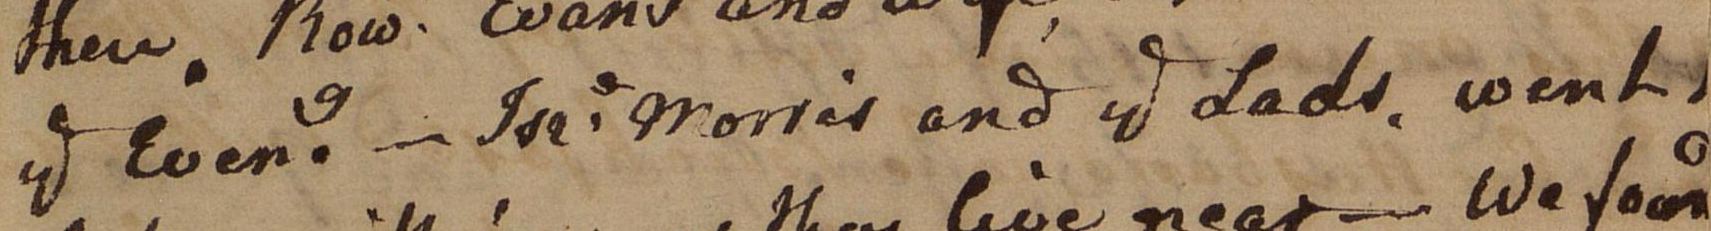y^e Even^g.- Isr^l. Morris and y^e Lads, went
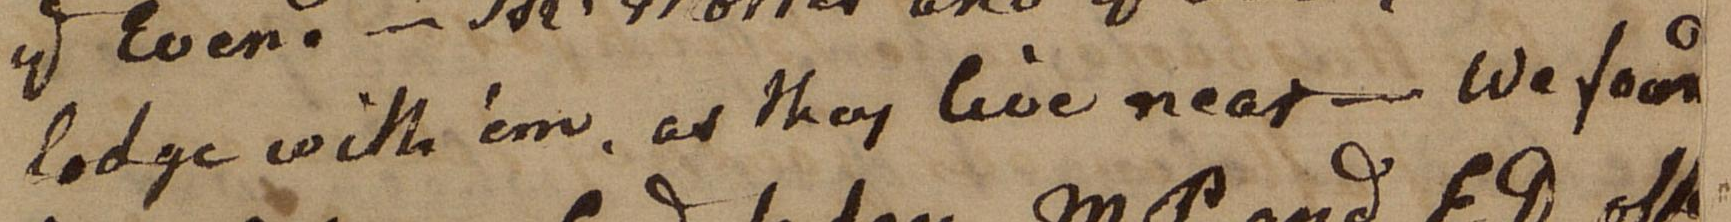lodge with 'em, as they live near- We found
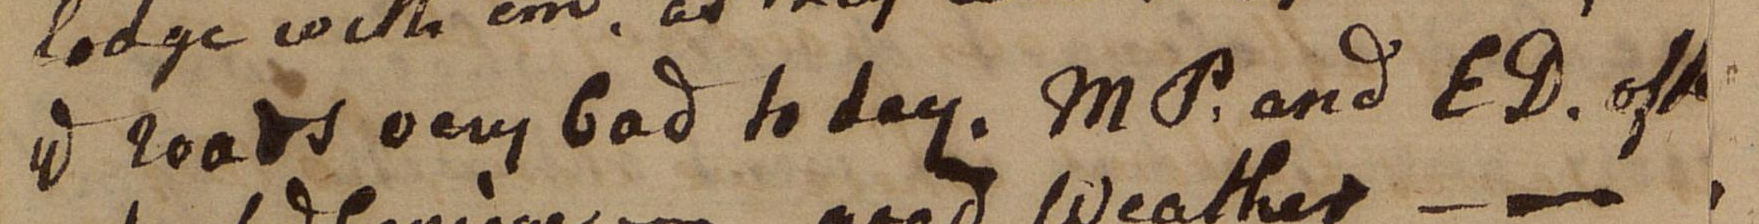y^e roads very bad to day. MP. and ED. off
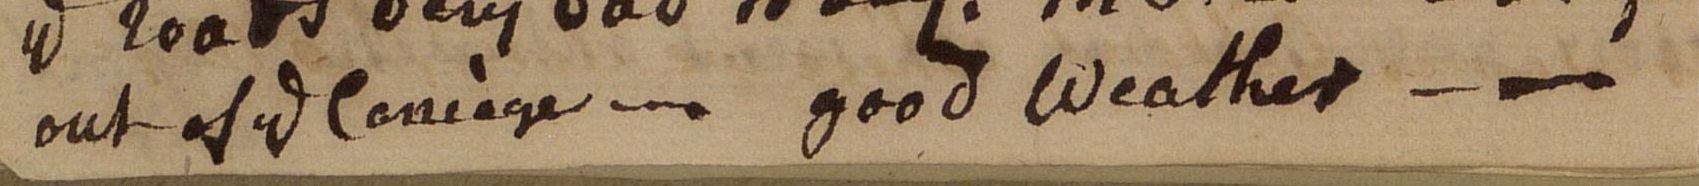out of y^e Carriage- good weather-
